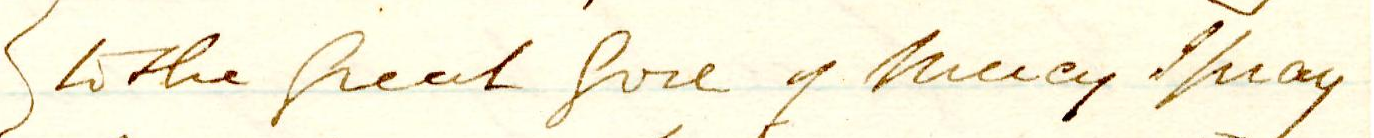to the Great God of mercy I pray
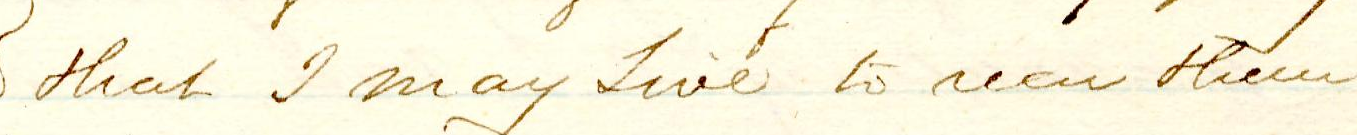that I may live now seen here
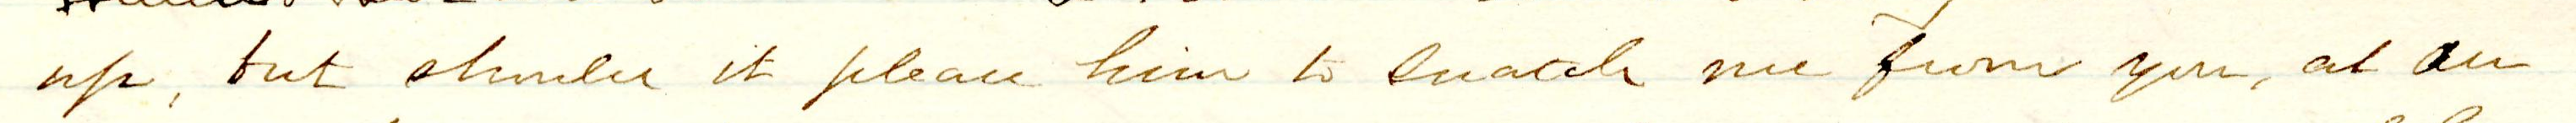up, but should it please him to snatch me from you, at an
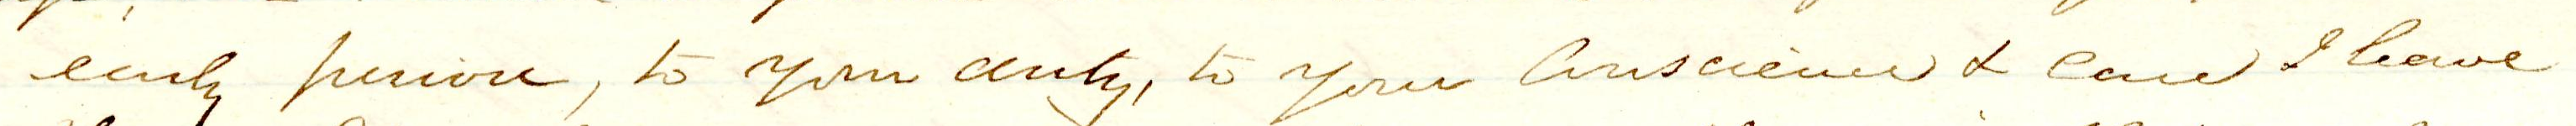early promise, to your duty to you and conscience & care I leave
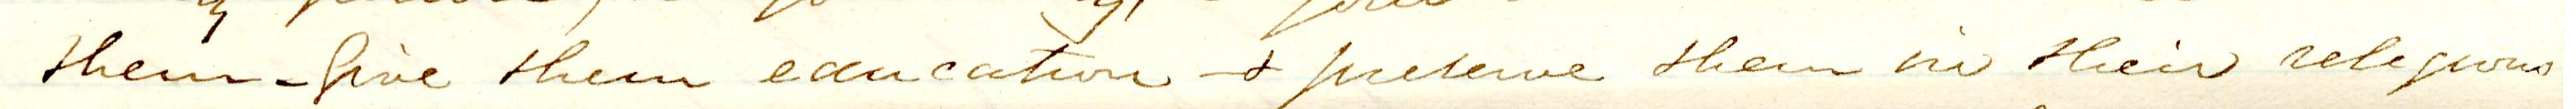them- Give them an occasion to preserve them in their religious
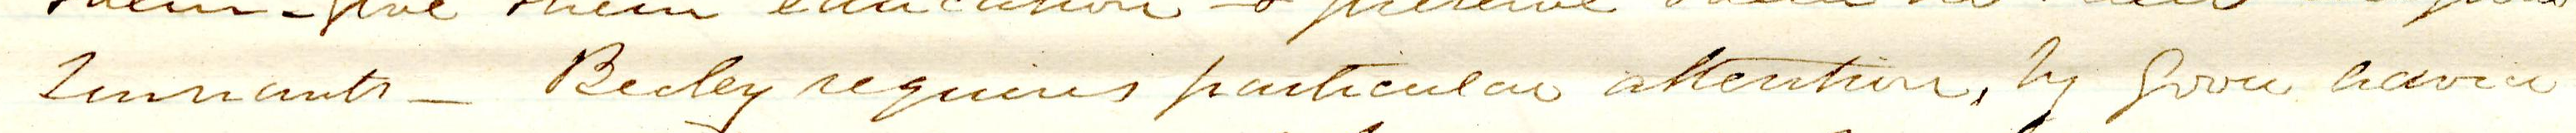remnants.- Becley requires particular attention, by Good advice
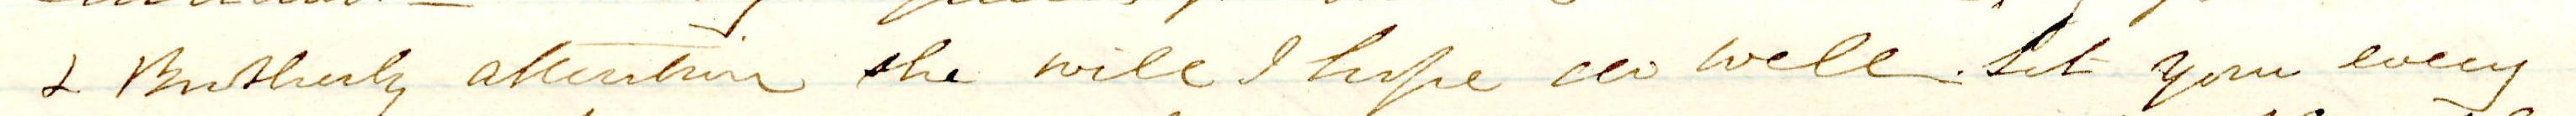& Brotherly attention she will I hope as well let your every
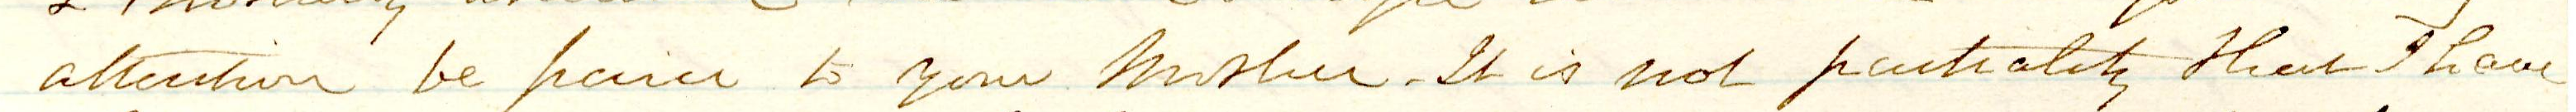attention be paid to your Brother- It is not partiality that I have
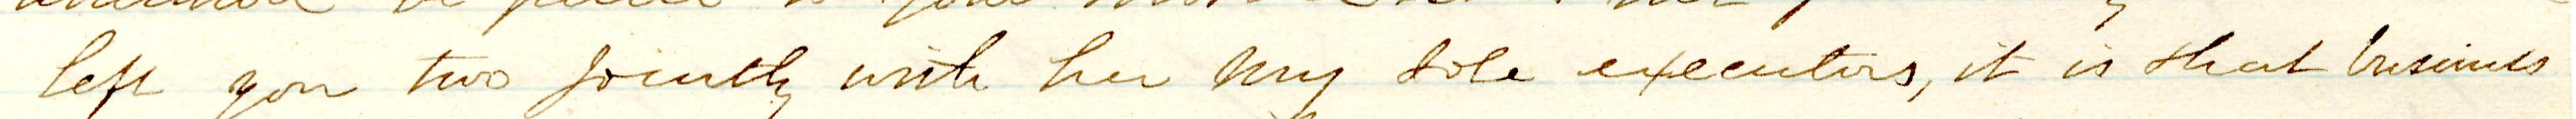left you two jointly with her my sole executors, it is that business
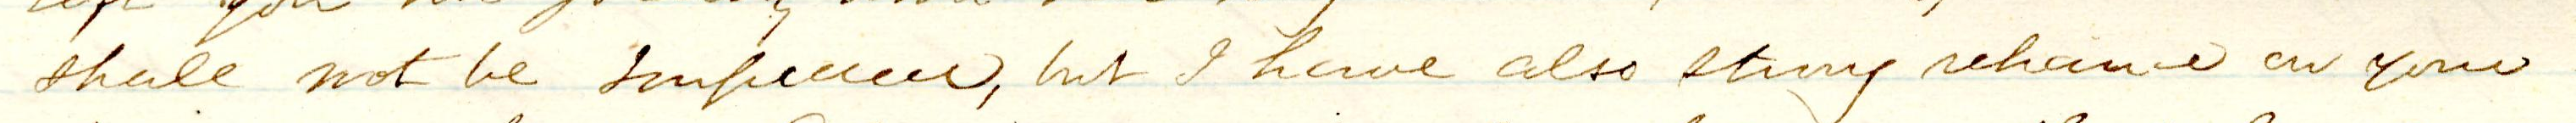shall not be Impeded, but I have also strong reliance on your
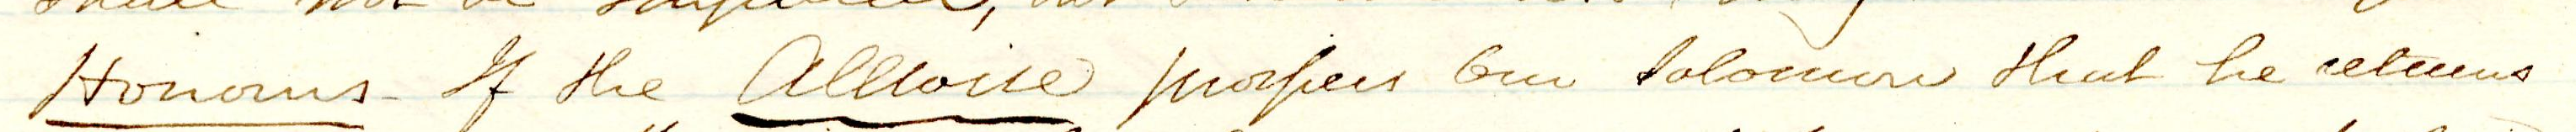Hounours If the Alliance profers our Solomon that he returns
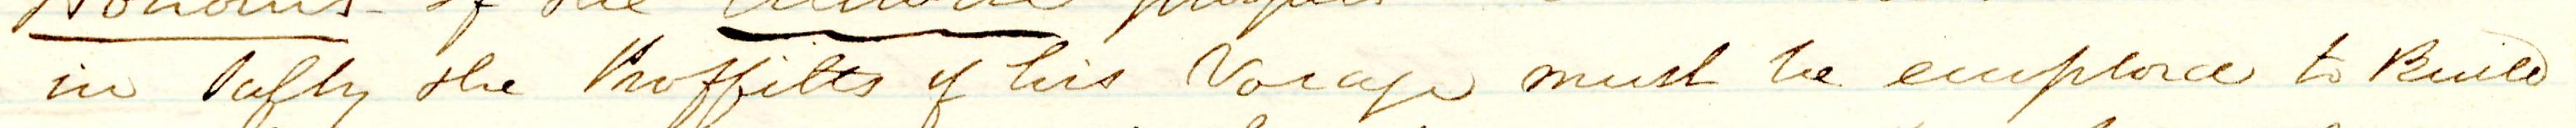in safly the proffits of his Voyage must be eccplord to Build
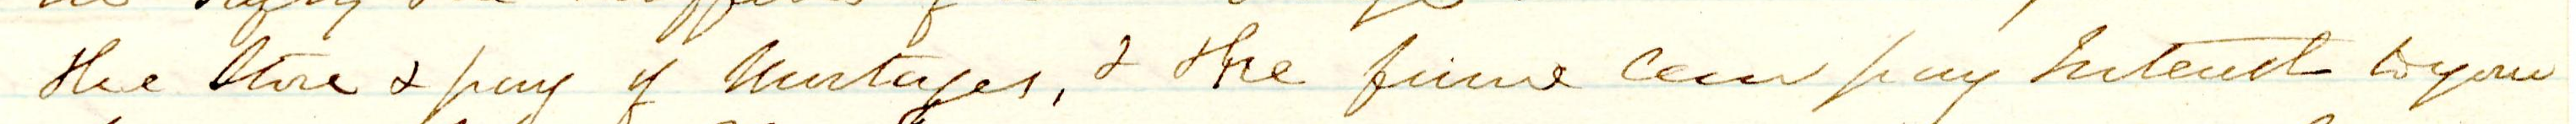the Store & pay of Mortgages, & the friends care pay Interest to you
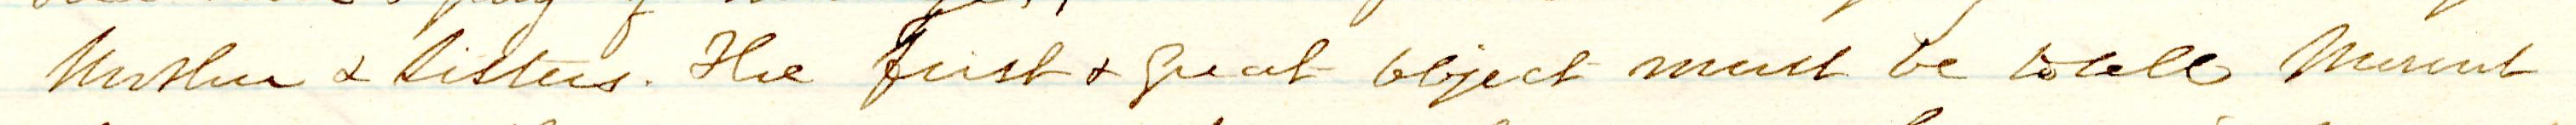Mother & Sisters. The first & great object must be to sell Moment
